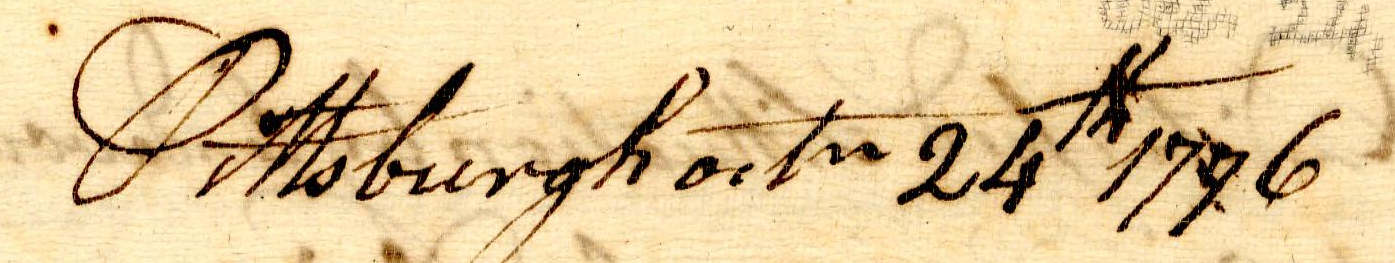Pittsburgh oct^r 24^th 1776
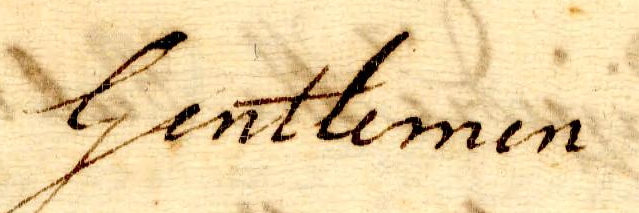Gentlemen
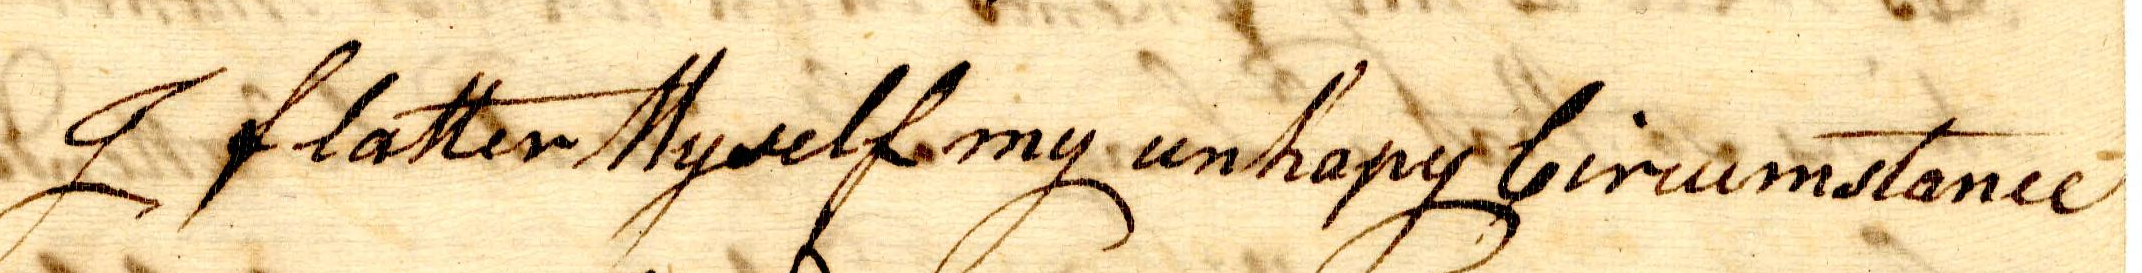I flatter Myself my unhapy Circumstance
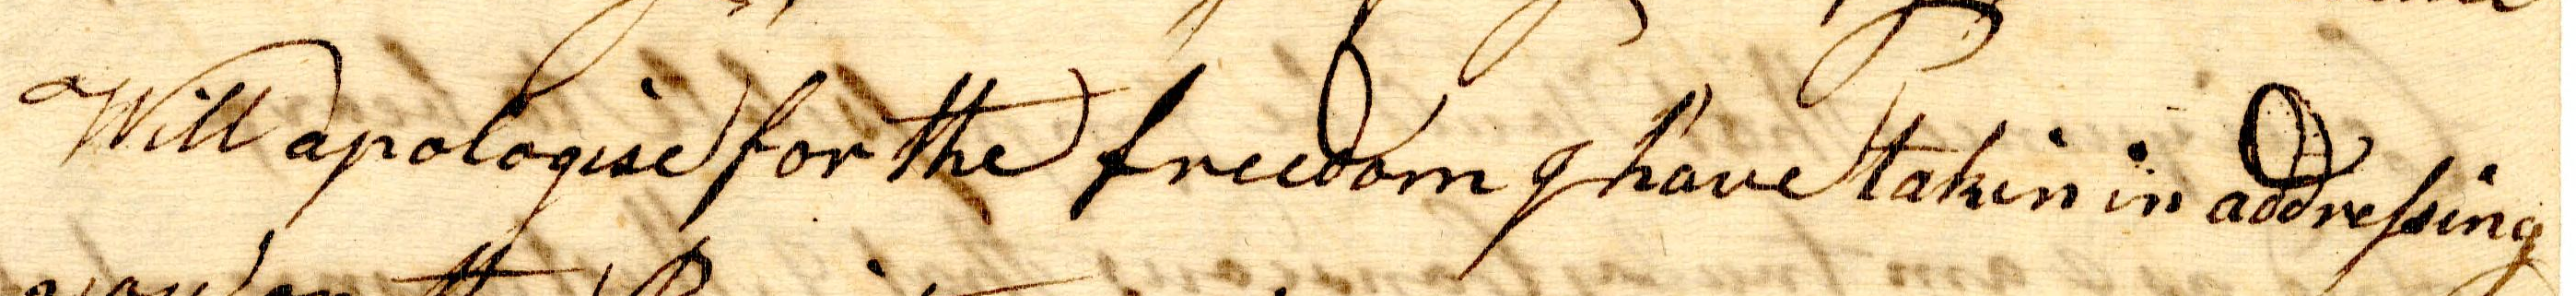Will apologise for the freedom I have taken in addressing
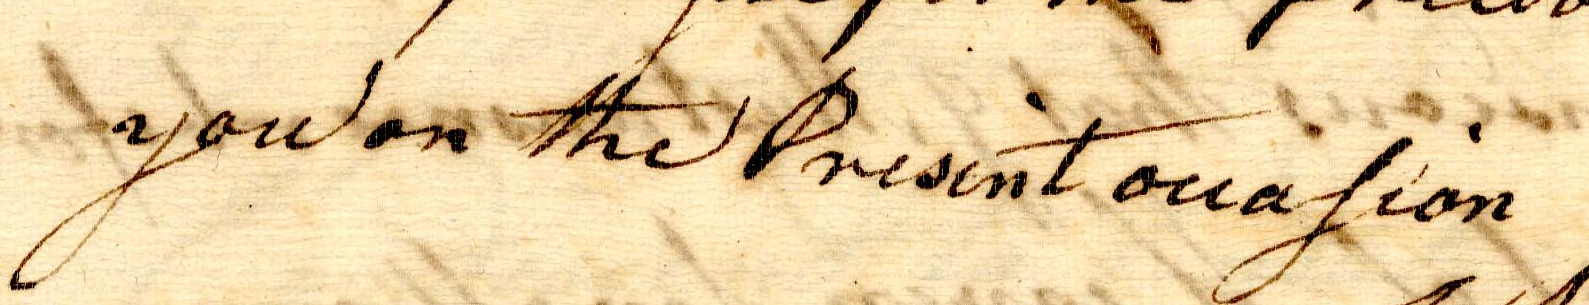you on the Present occasion
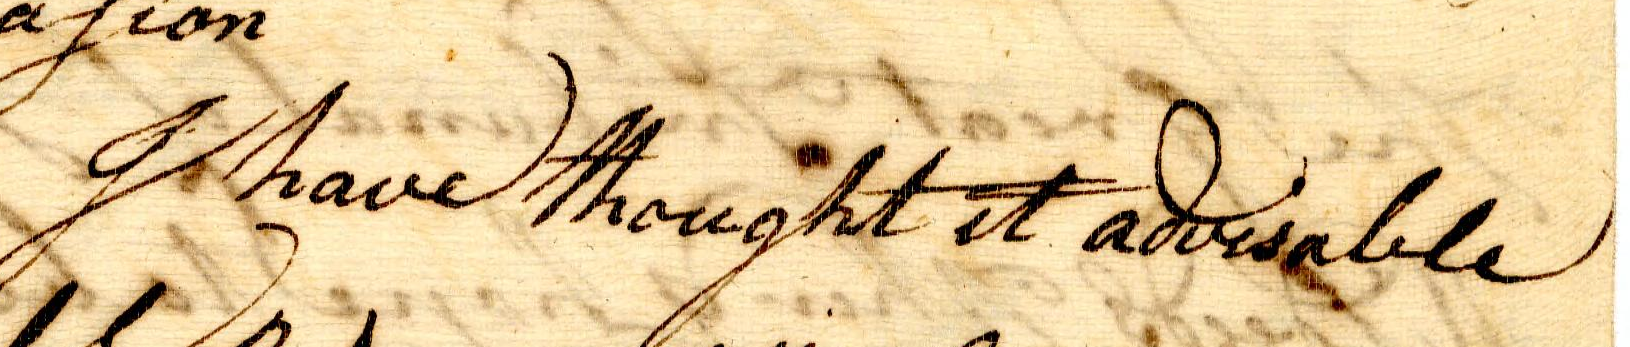I have thought it advisable
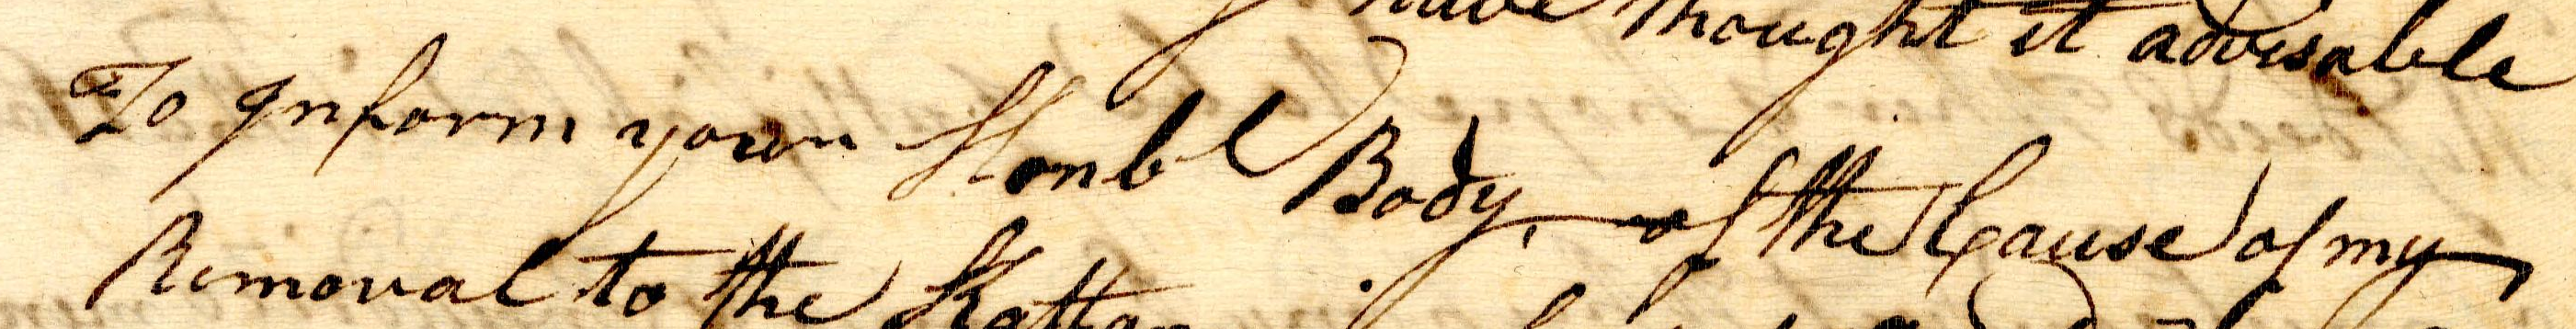To inform your Honbl Body, of the Cause of my
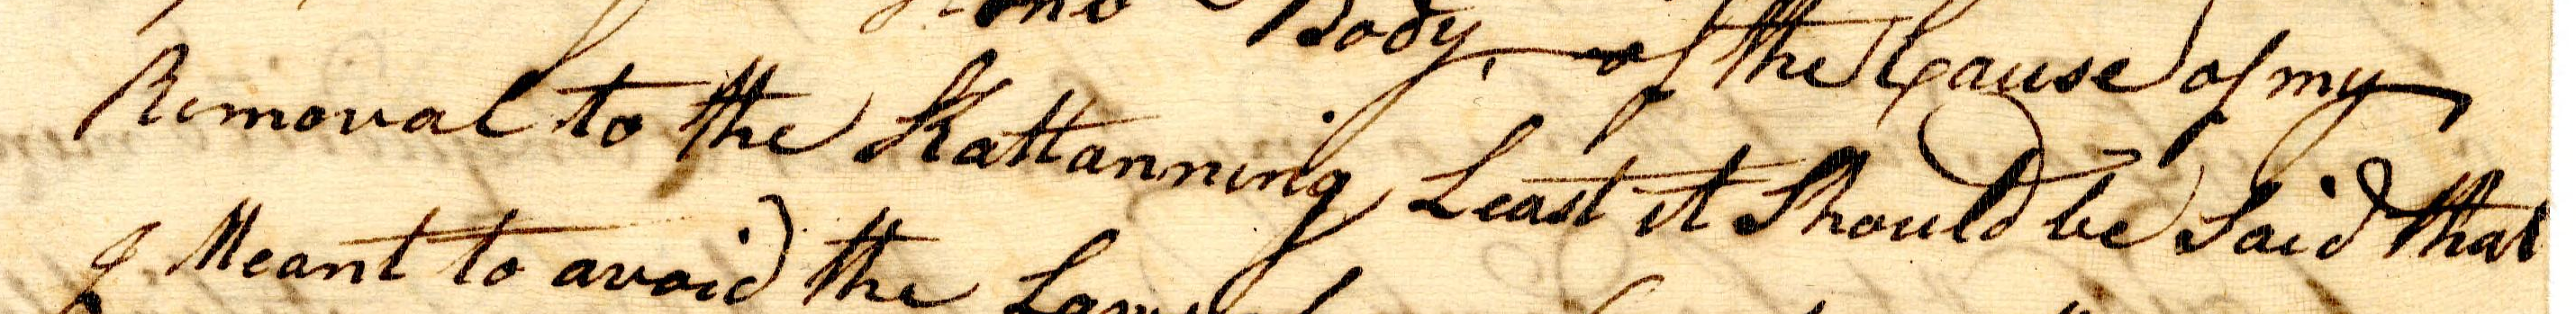Removal to the Kattanning Least it should be said that
